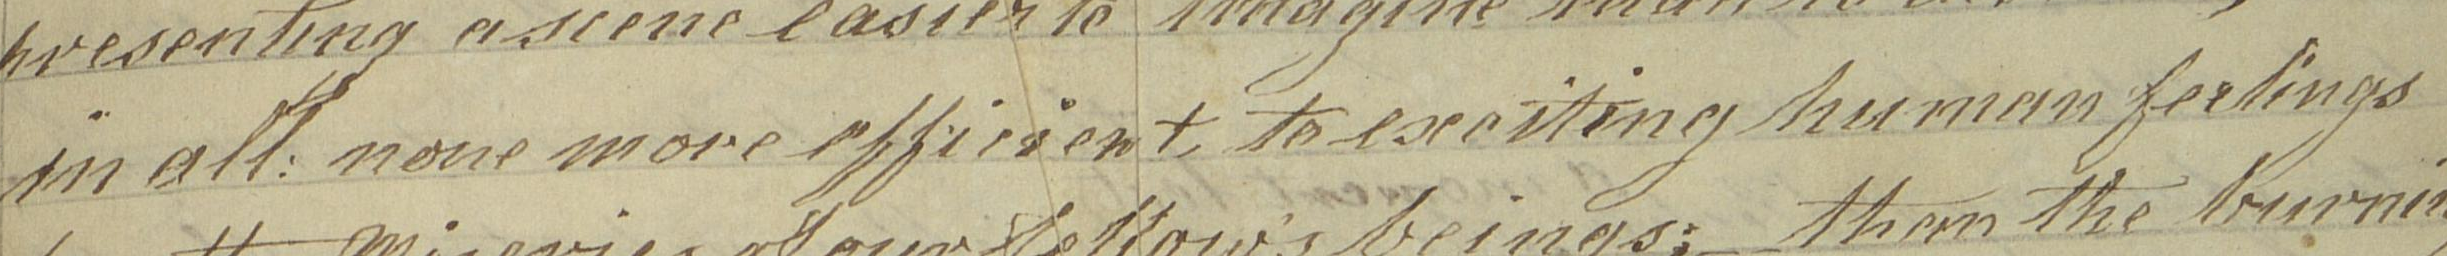in all none wore efficient to exciting human feelings
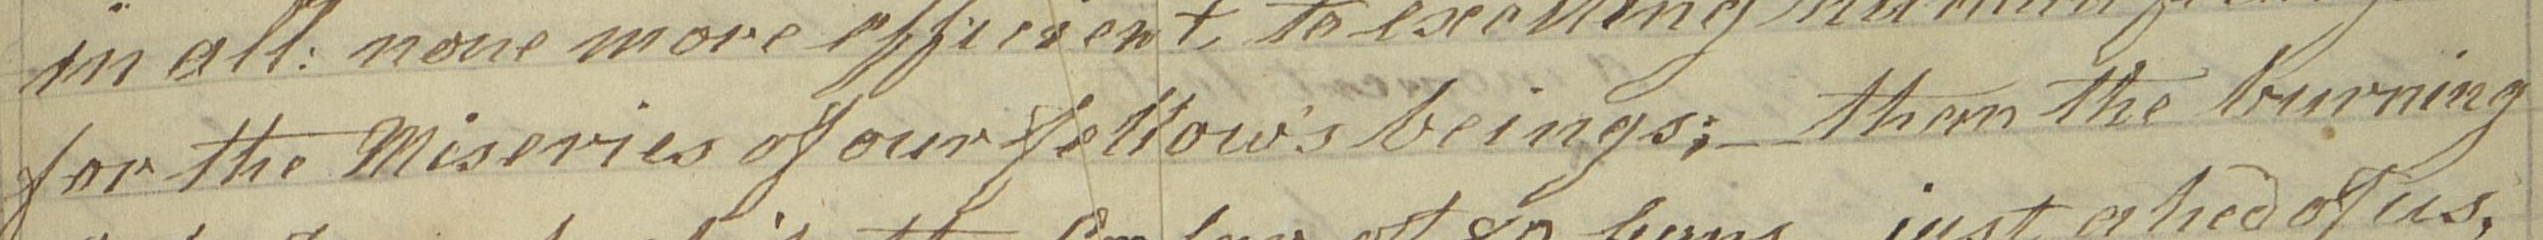for the Miseries of our fellow's beings; then the burning
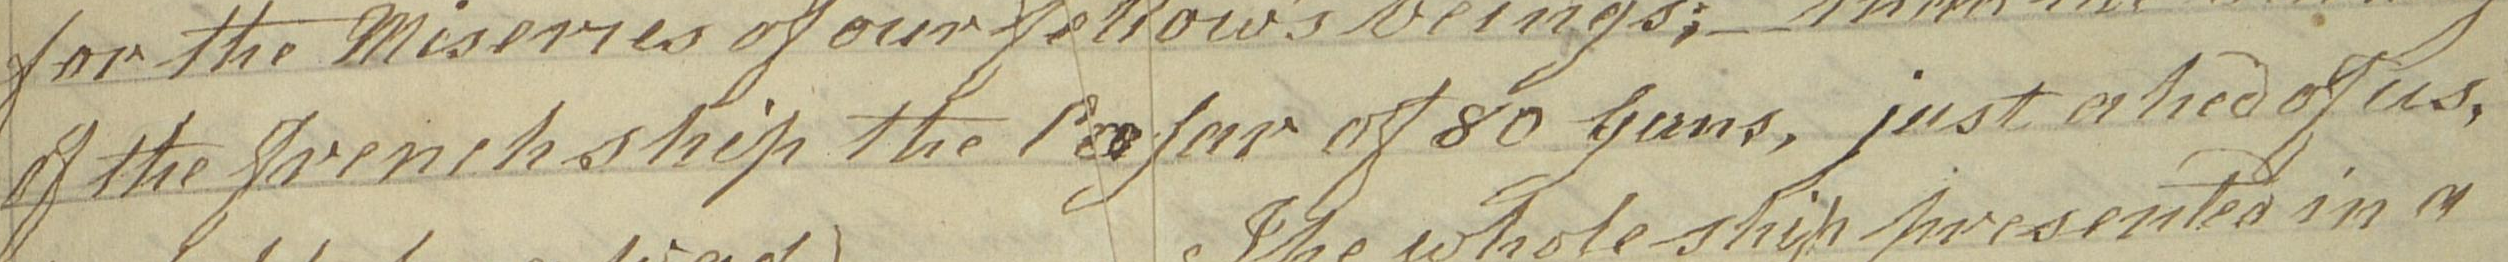of the french ship the Casar of 80 Guns, just ahed of us,
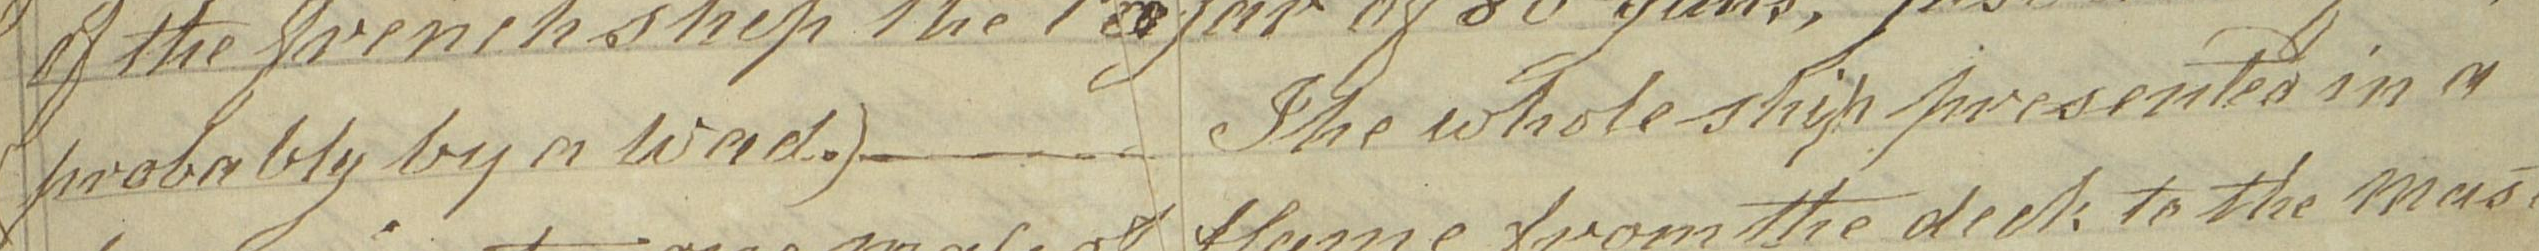(probably by a wad.) The whole ship presentd in a
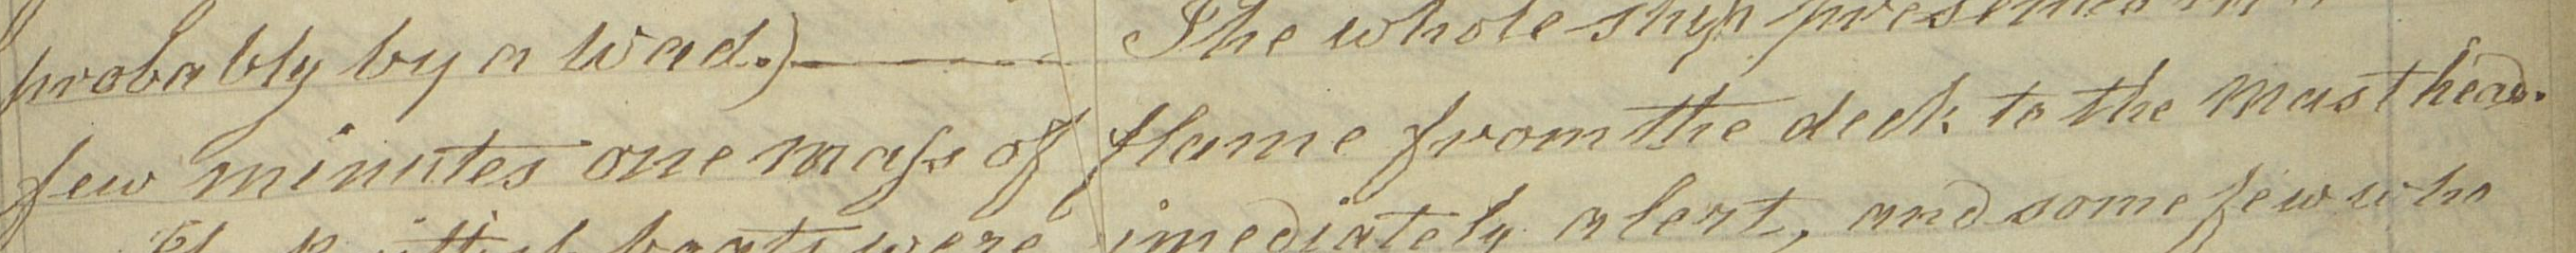few minutes one mass of flame from to deck to the mast head.
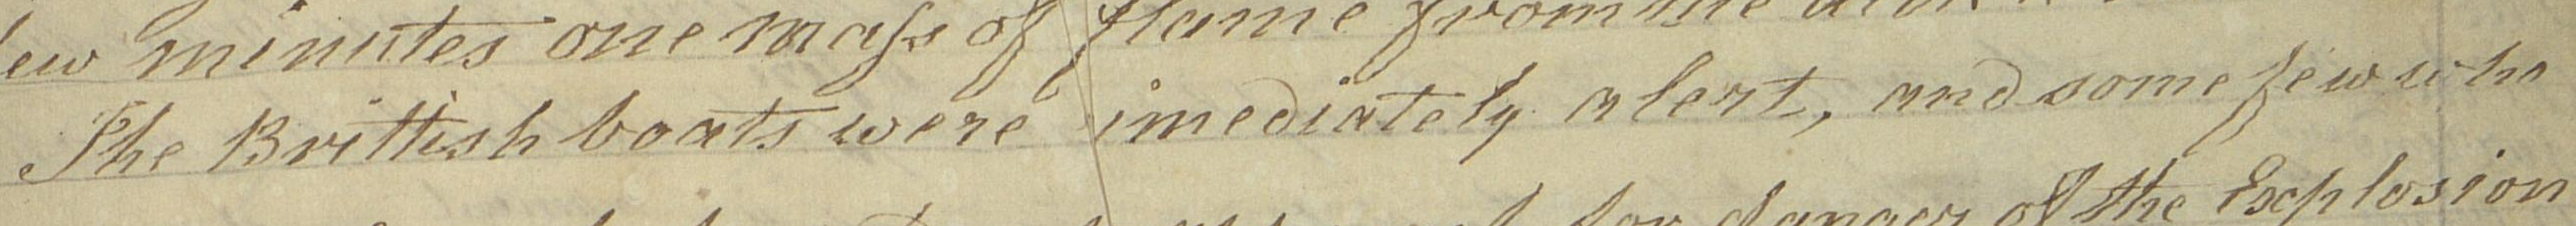The Brittish boats were imediately alert, and some few who
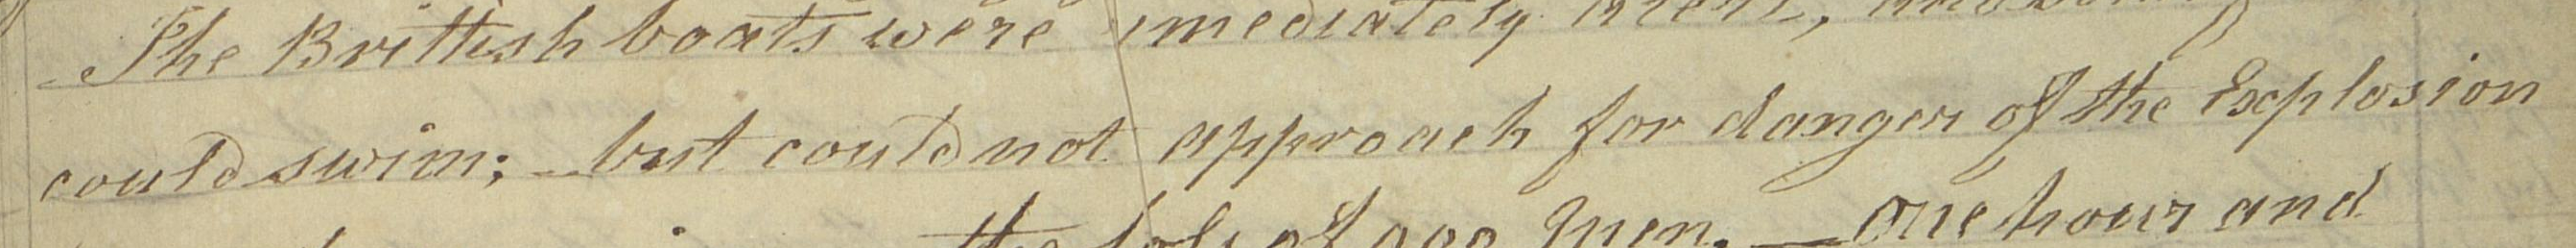could swim; but could not approach for danger of the Explosion
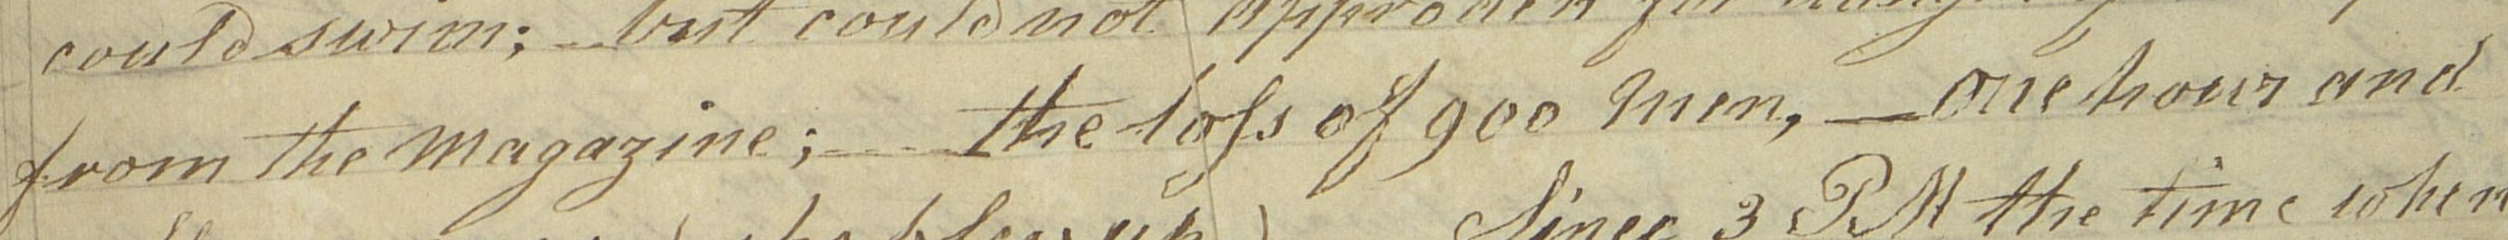from the magazine; the loss of 900 men, one hour and
